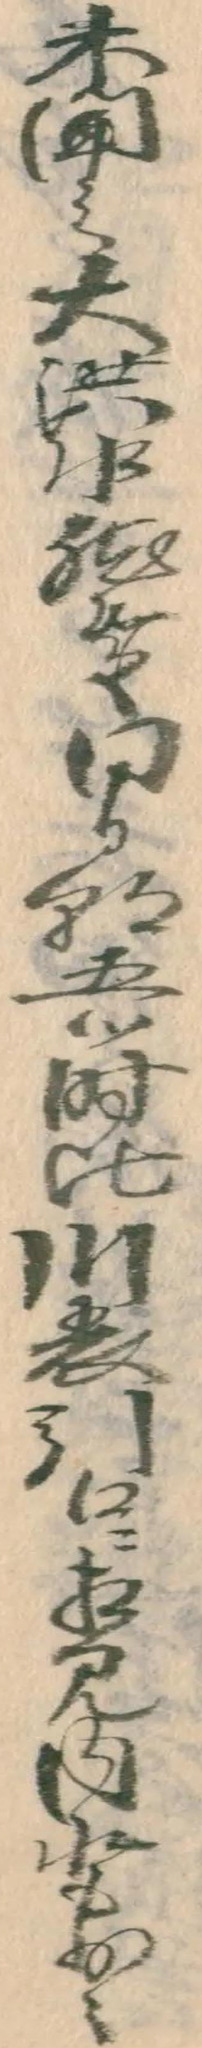未聞之大洪水然処同日朝五ッ時比川表引口二相見内水も少々
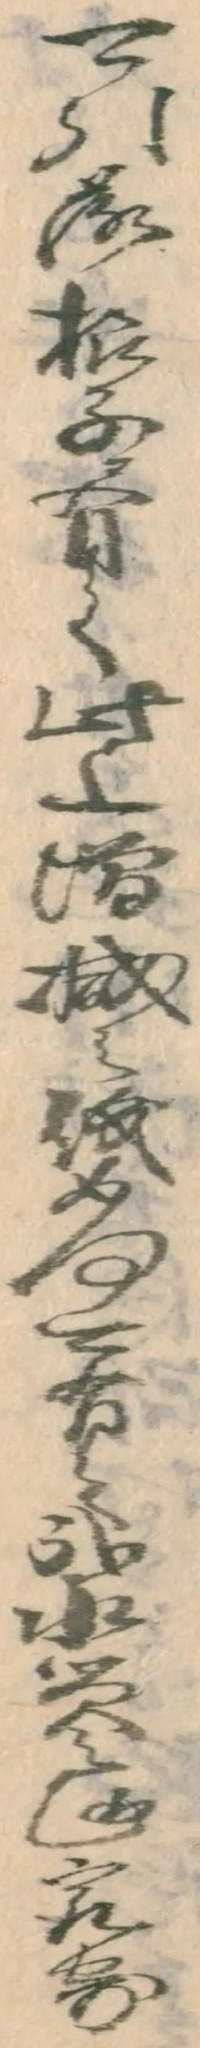可引落様子二有之此上増減之儀如何可有之哉水災之趣最寄

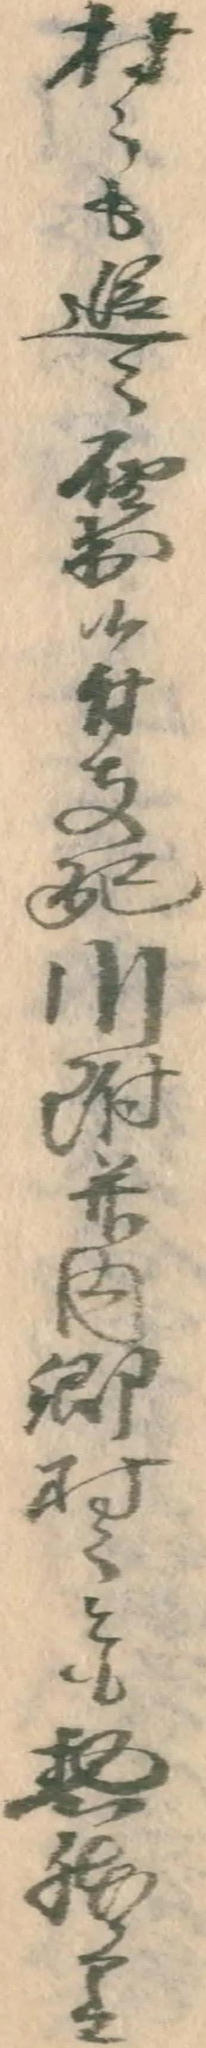村々も追々届出候付支配川附并内郷村々とも惣体申立
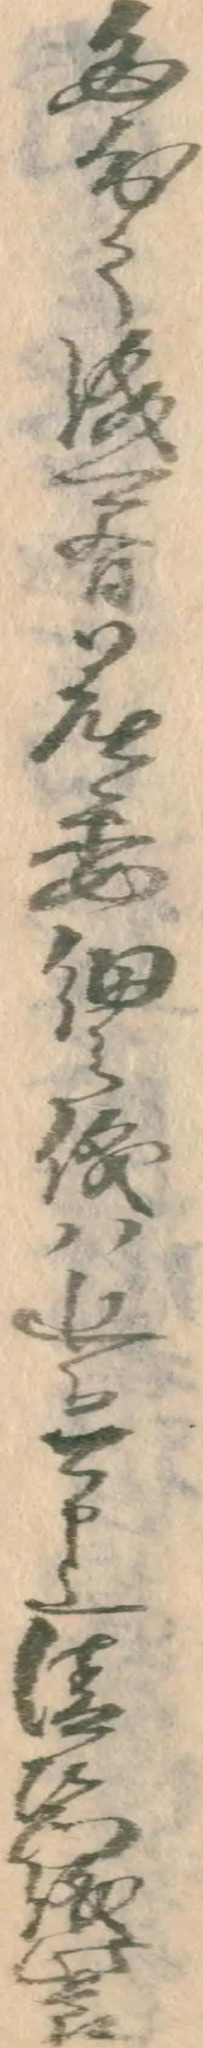多分之儀可有御座候委細之儀ハ追而可申上清左衛門儀此節
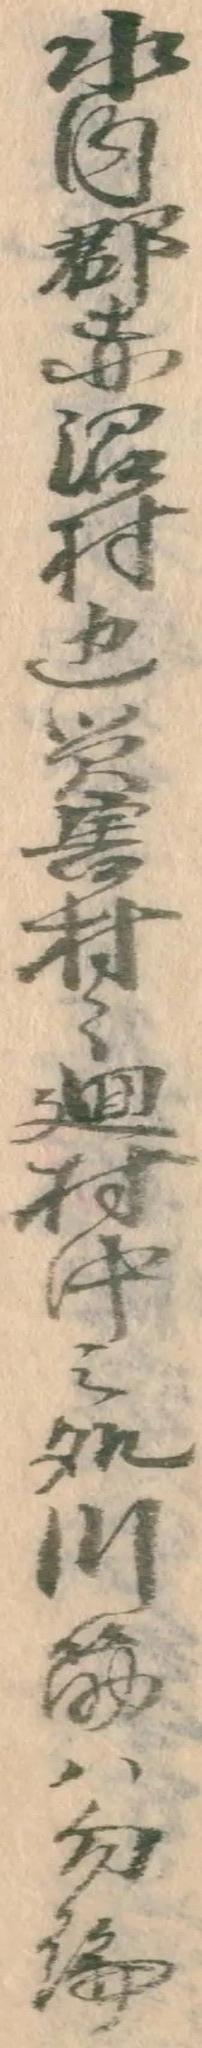水内郡赤沼村辺災害村々廻村中之処川筋ハ勿論
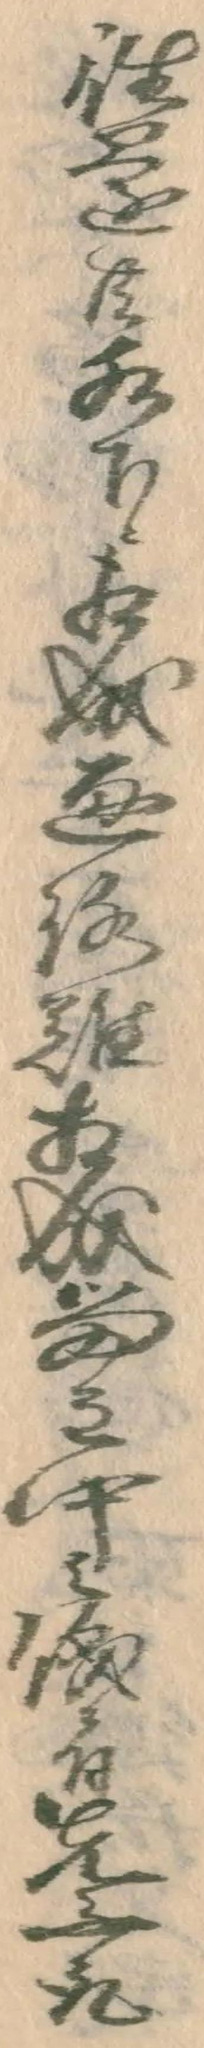往還共水下候相成通路難相成留主中之儀二付先不取
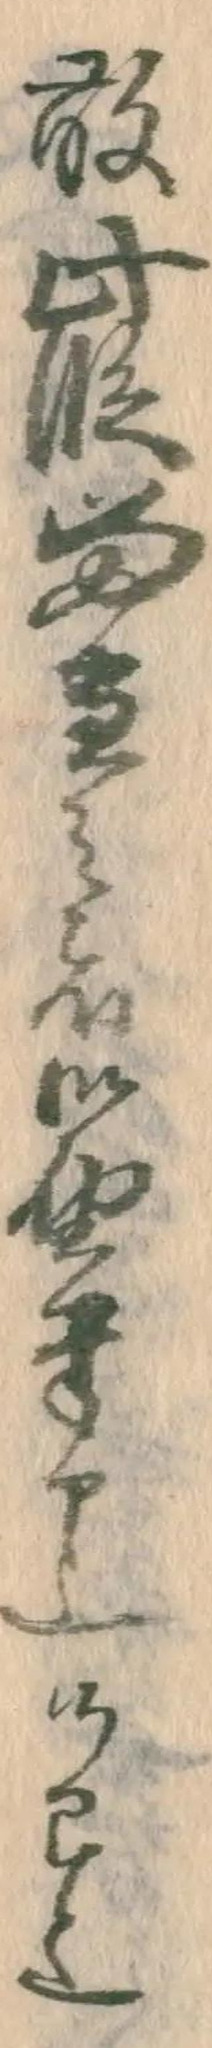敢此段留主之者御届奉申上候已上
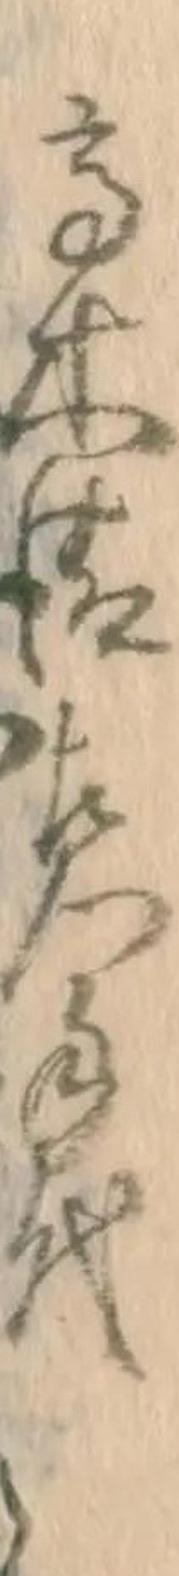高木清左衛門手代
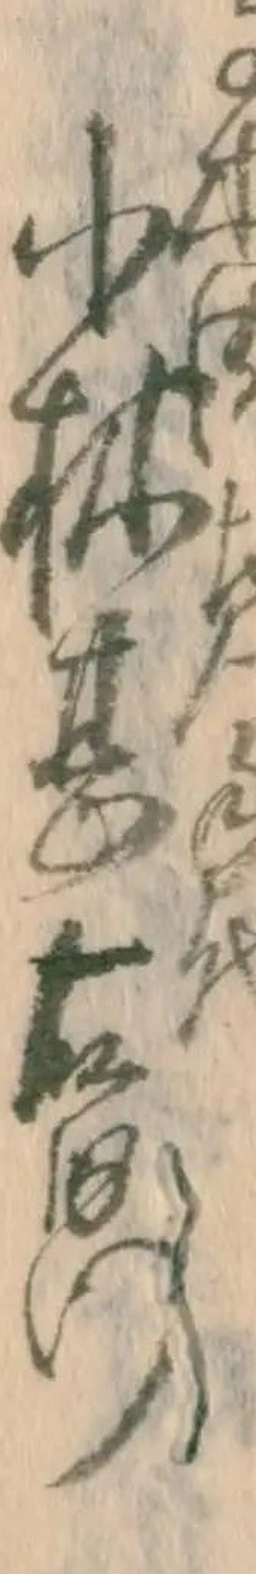小林甚左衛門
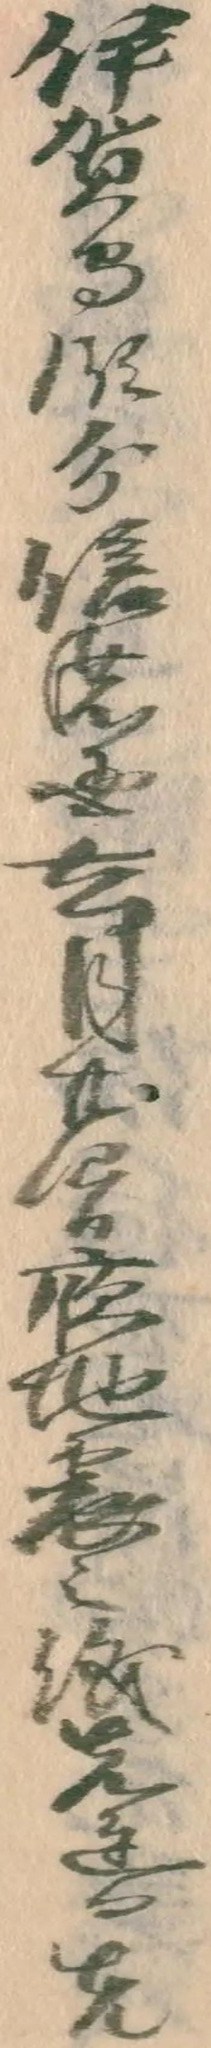伊賀守領分信濃国去月廿四日夜地震之儀先達而先
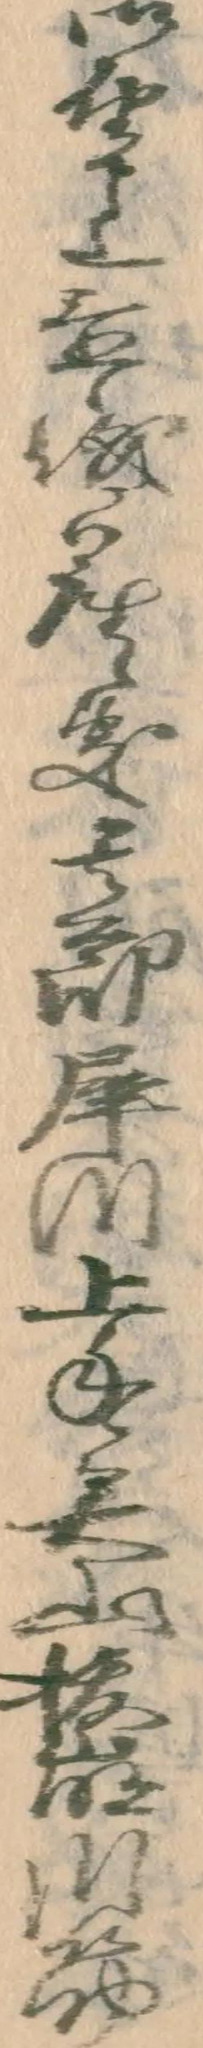御届申上置候儀二御座候処其節犀川上手灵山抜崩川筋
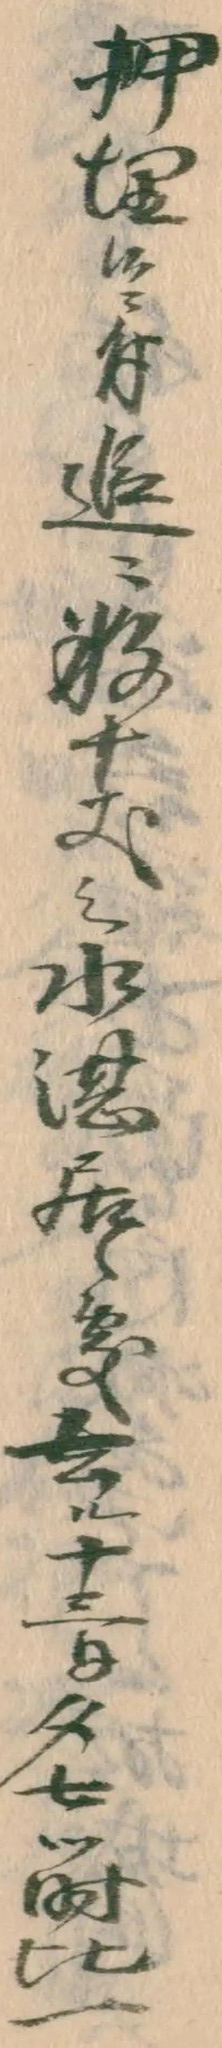押埋候二付追々数十丈之水湛居候処去十三日夕七ッ時比一
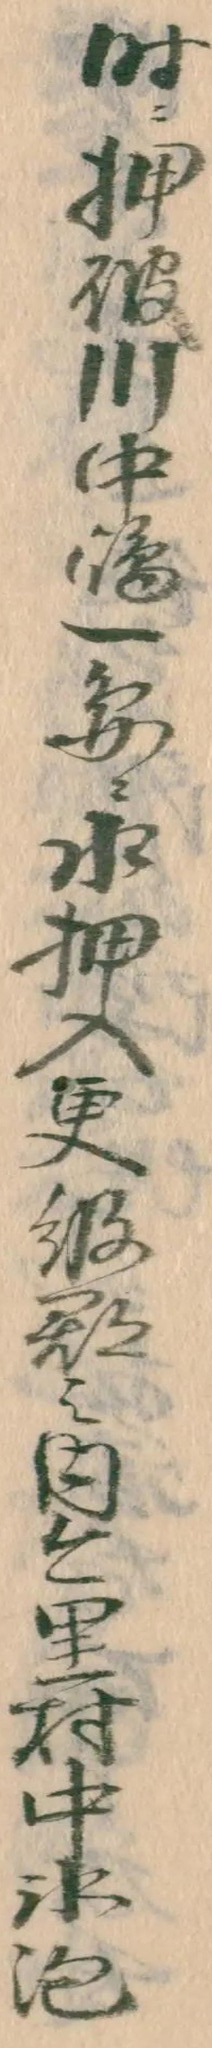時二押破川中嶋一円二水押入更科郡之内今里村中氷鉋
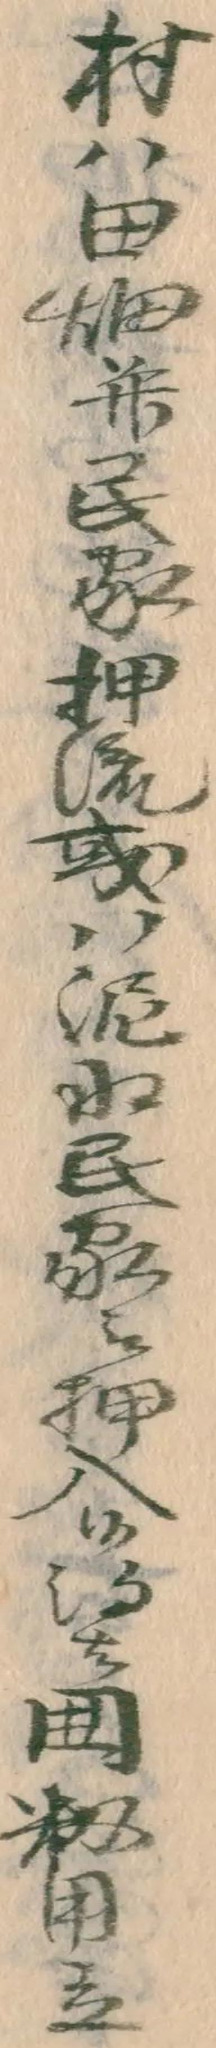村ハ田畑并民家押流或ハ泥水民家二押入候得者囲籾用立
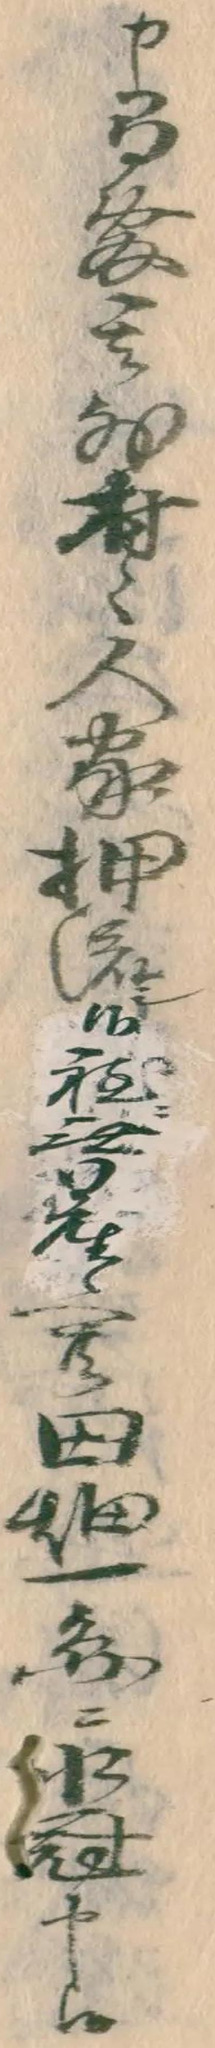申間敷其外村々人家押流候程二無御座候へ共田畑一円二水冠申候
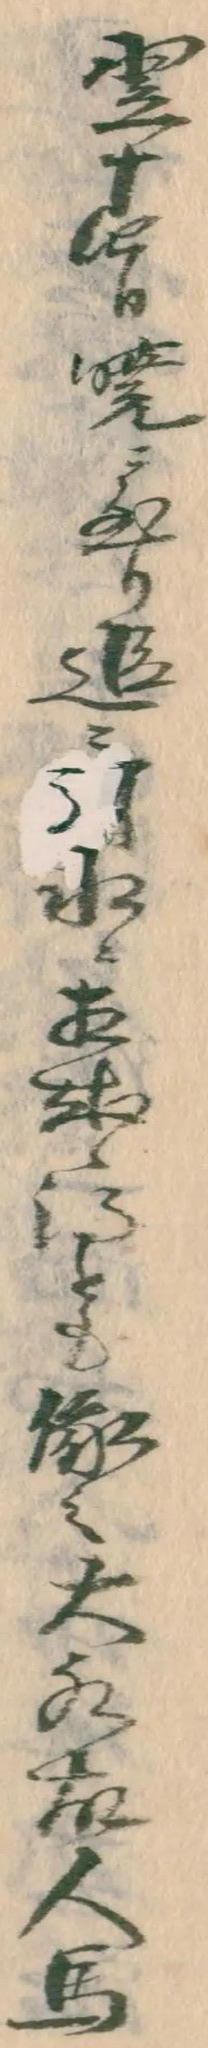翌十四日暁二至り追々引水二相成候得とも俄之大水故人馬
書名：信州大地震之記
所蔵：国立国会図書館 National Diet Library, JAPAN
